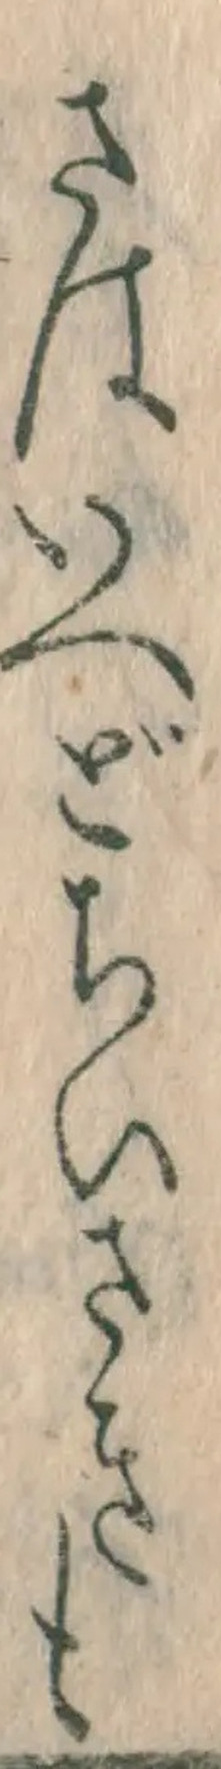さはいへどちいさきも
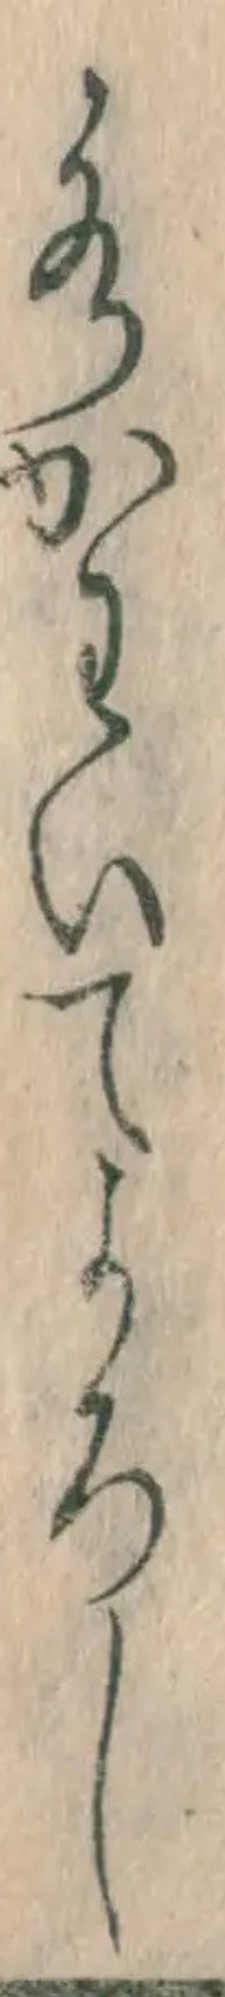水かわいてよろし
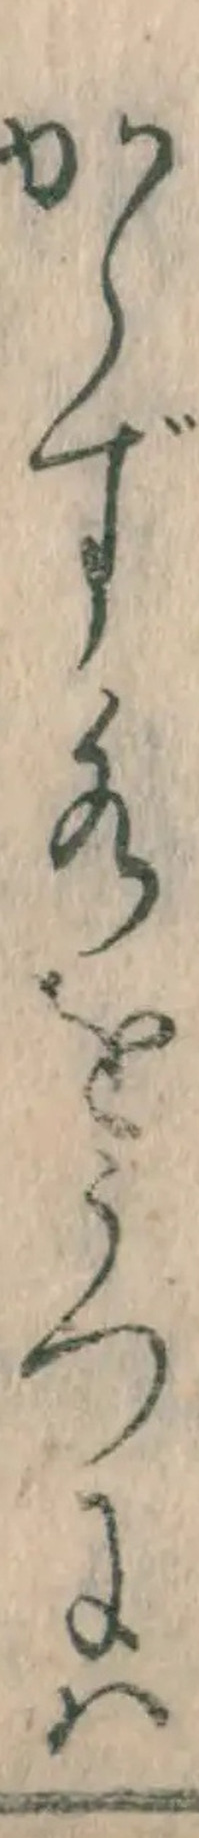からず水をうつには

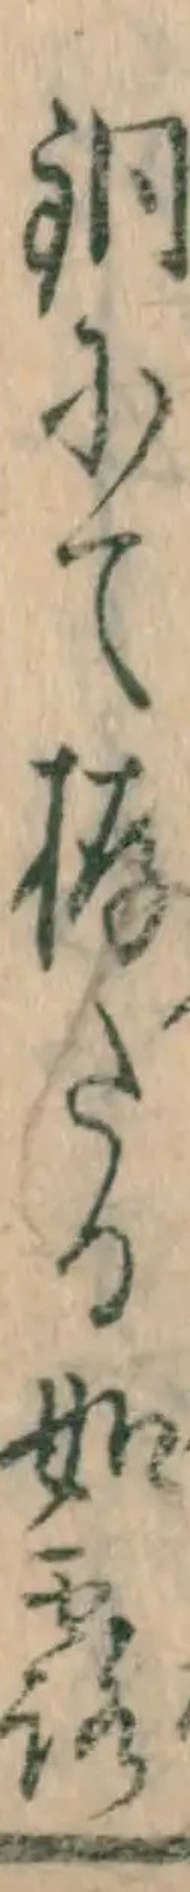銅にて拵たる如露
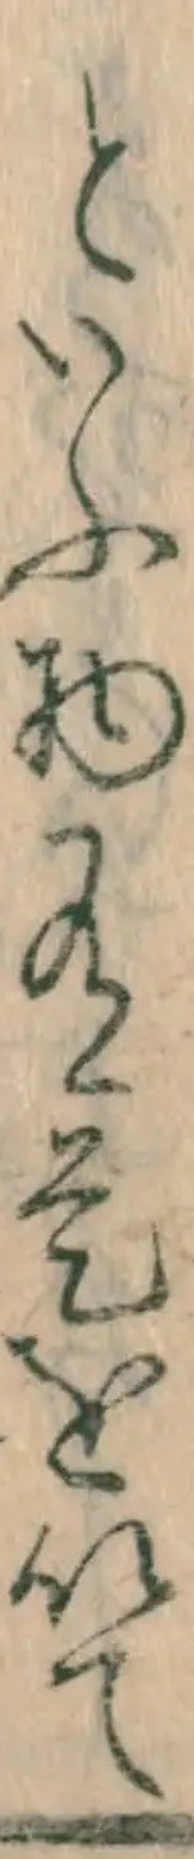といふ物有是を以て
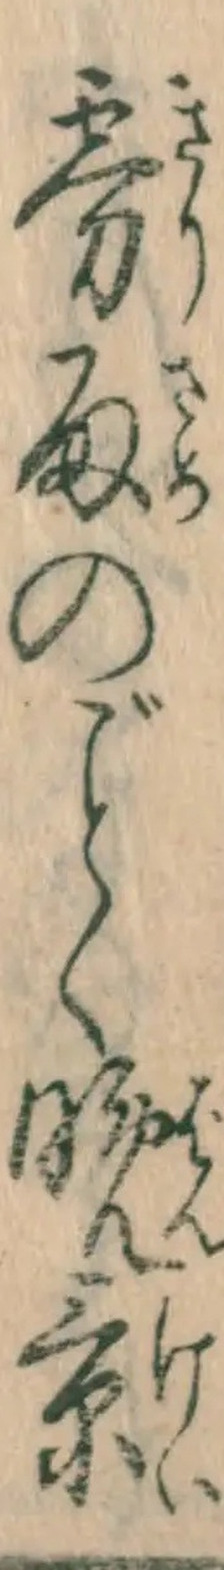霧雨のごとく晩景
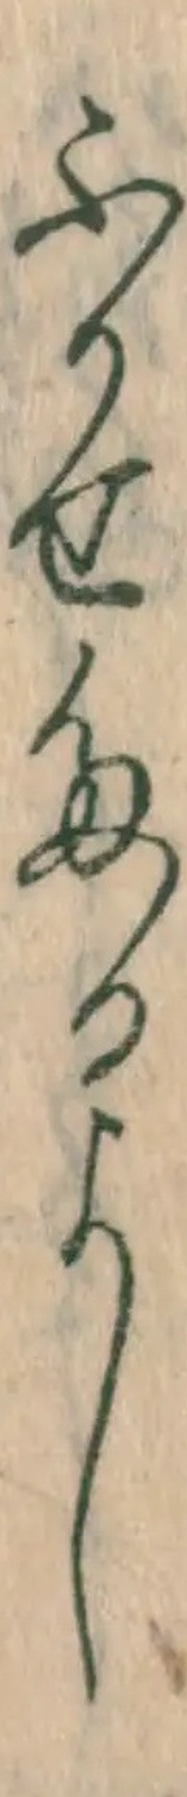ふかせたるよし
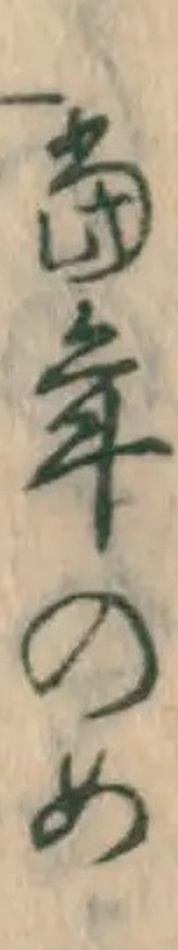当年のめ
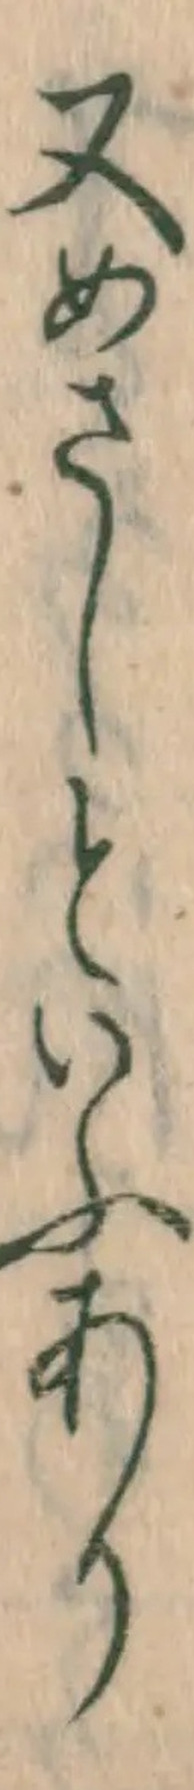又めさしといふあり
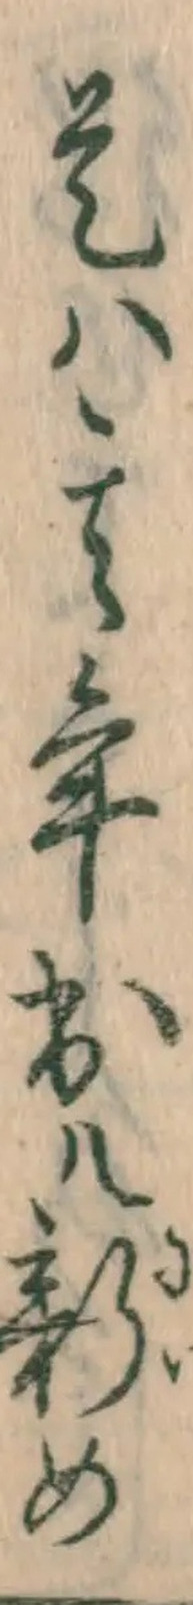是は其年出新め
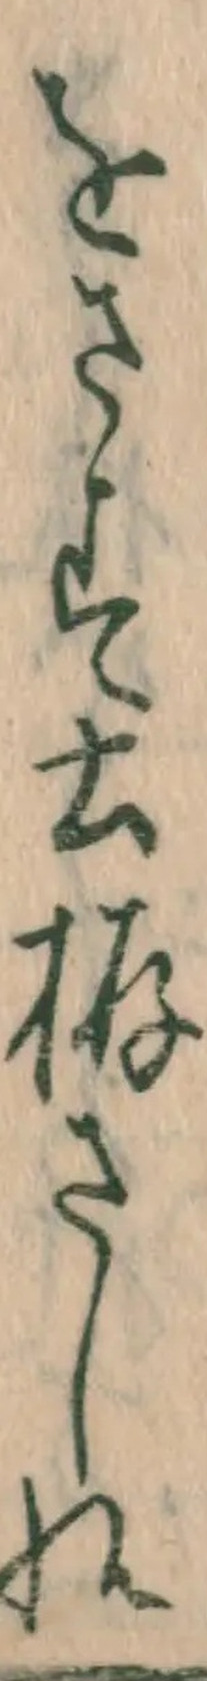をさす土拵さし様
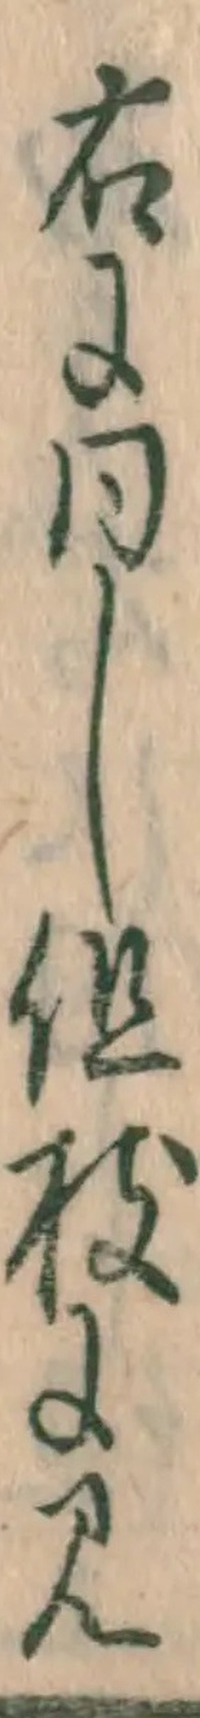右に同し但枝に見
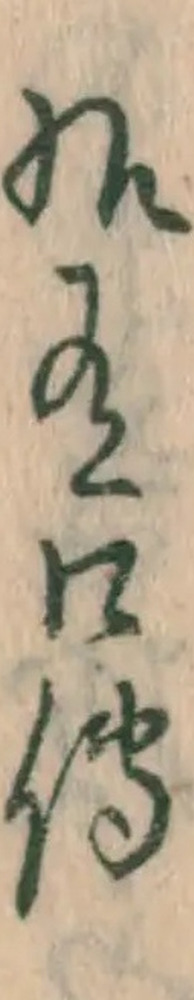様有口伝
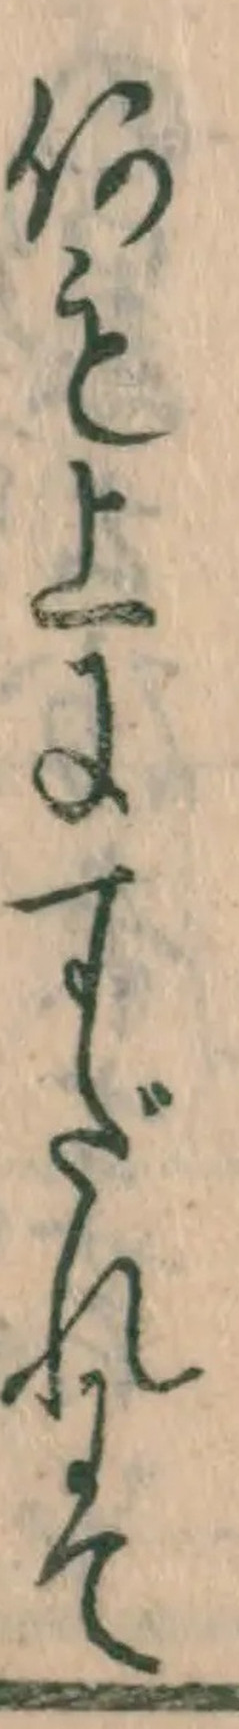何を上にすだれにて
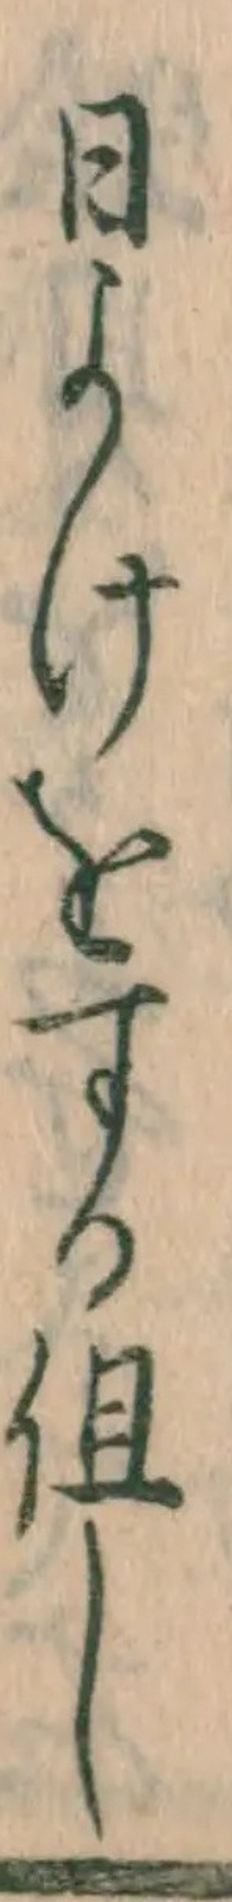日よけをする但し
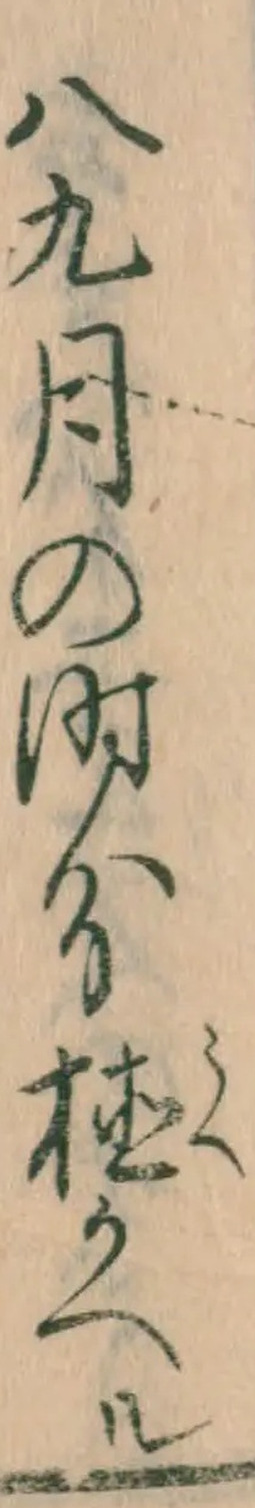八九月の植かへ
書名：錦繍枕 5巻. [5]
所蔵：国立国会図書館 National Diet Library, JAPAN
